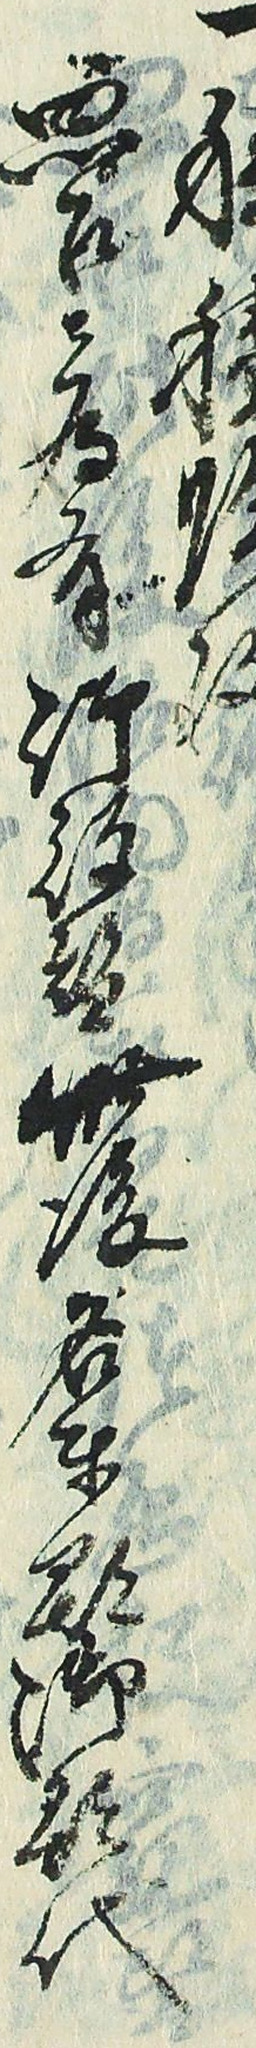思召被為有御役替此後名東郡御郡代
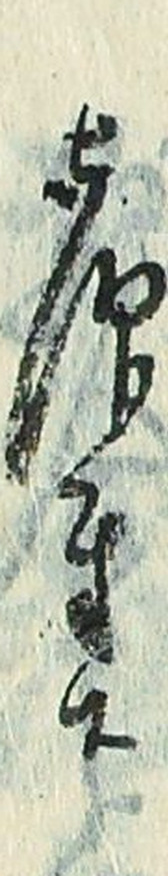被仰付候
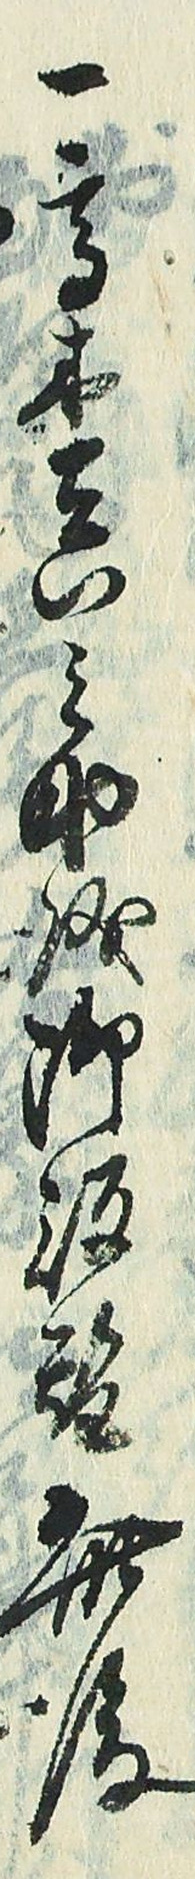一高木真之助儀御役替此後
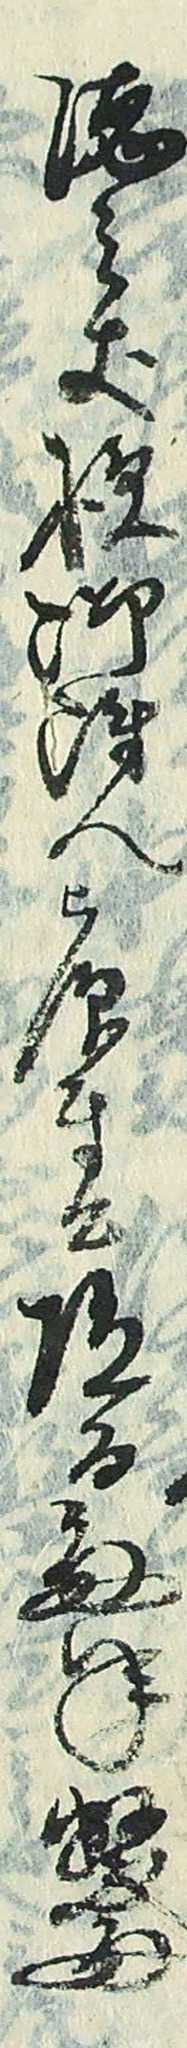徳之丈様御附人被仰付候随而毎年繁多

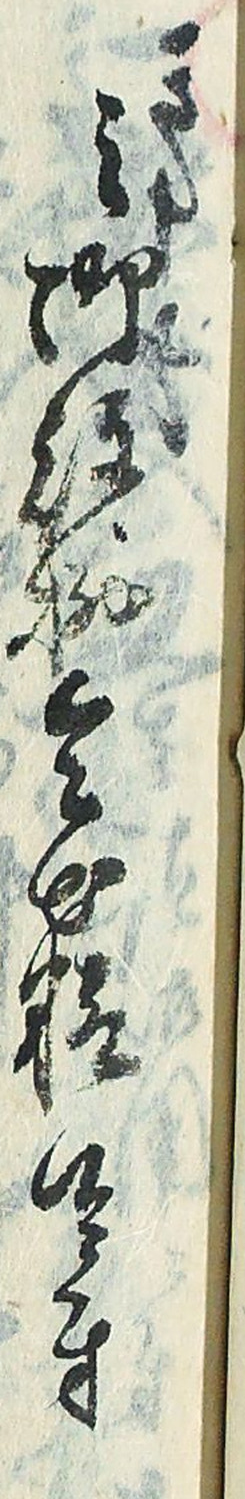之御役柄令出精候ニ付
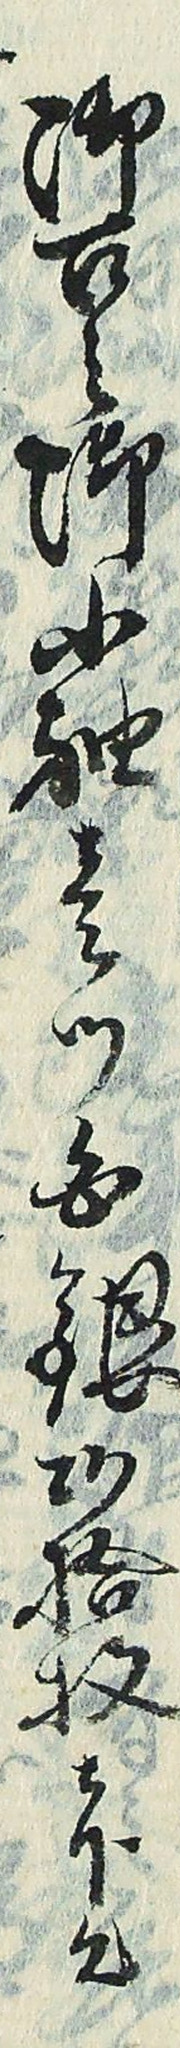御召之御小袖壱ツ白銀弐拾枚被下候
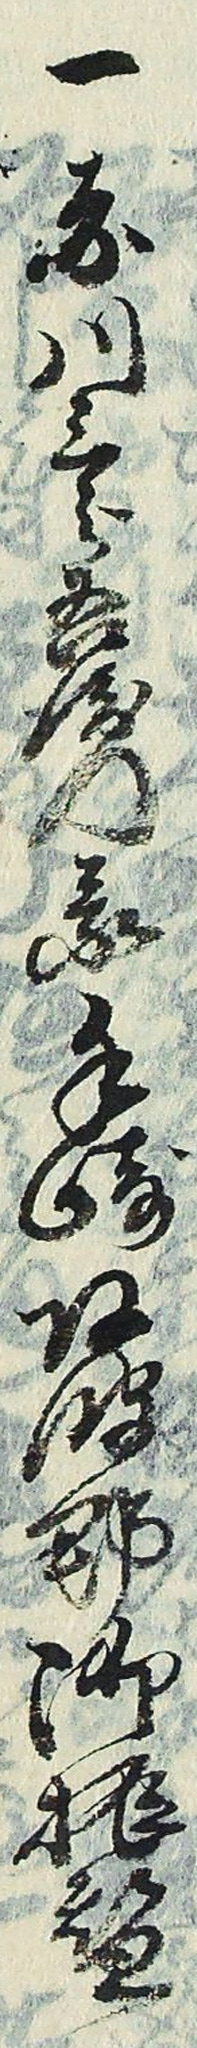一赤川三郎右衛門義手崎阿波郡御振替
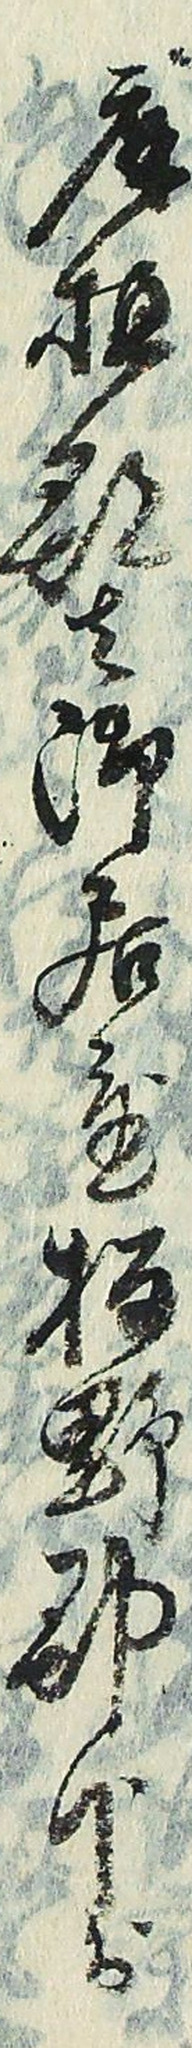麻植郡者御居置板野郡下分
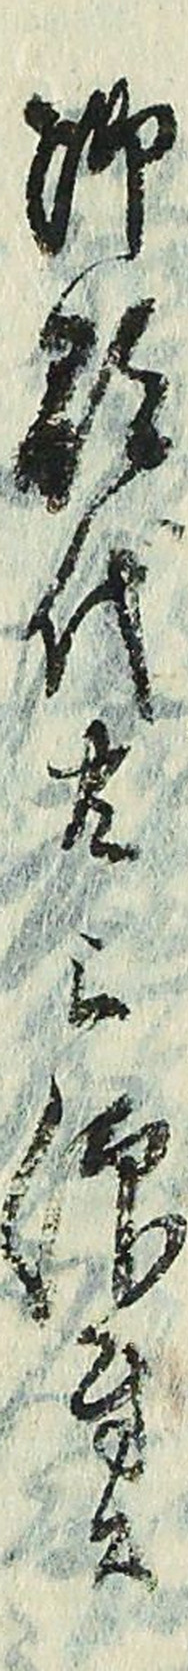御郡代共被仰付候
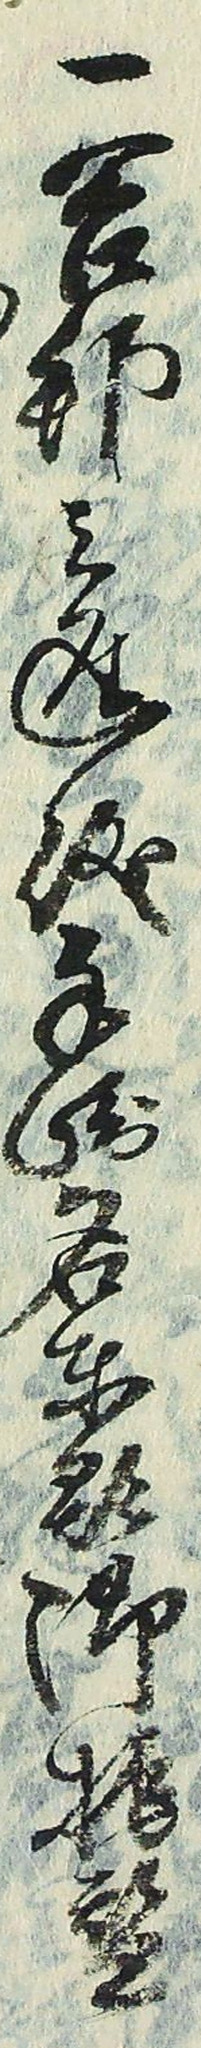一谷邦之進儀手崎名東郡御振替
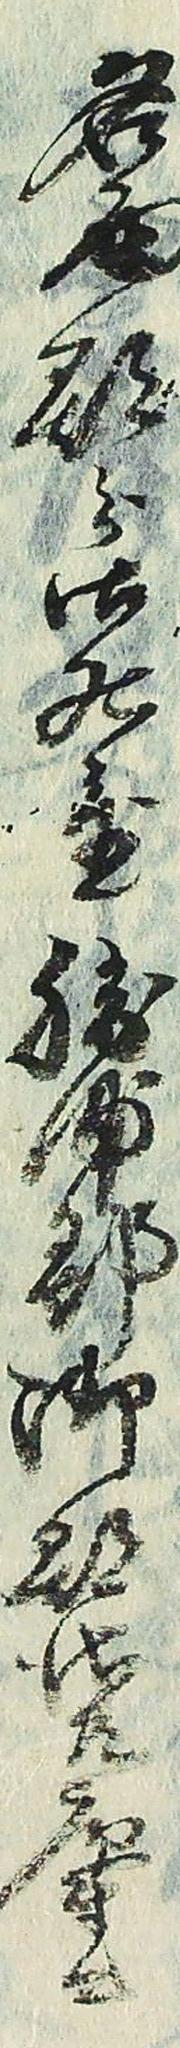名西郡分御居置勝浦郡御郡代共被仰付候
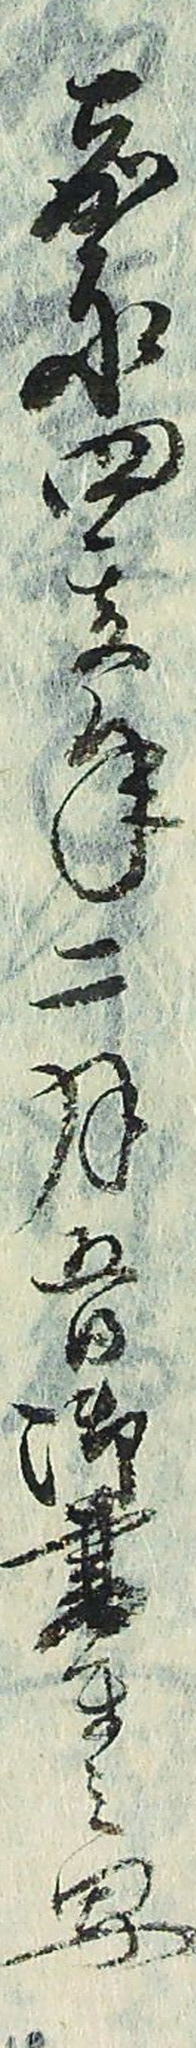嘉永四亥年二月五日御書付之写
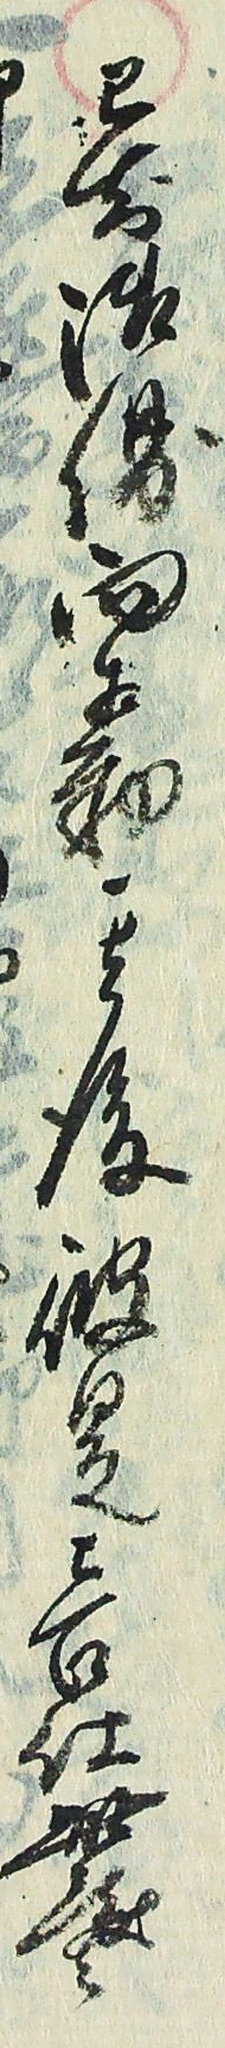已前御側向相勤其後彼是被召仕此度者
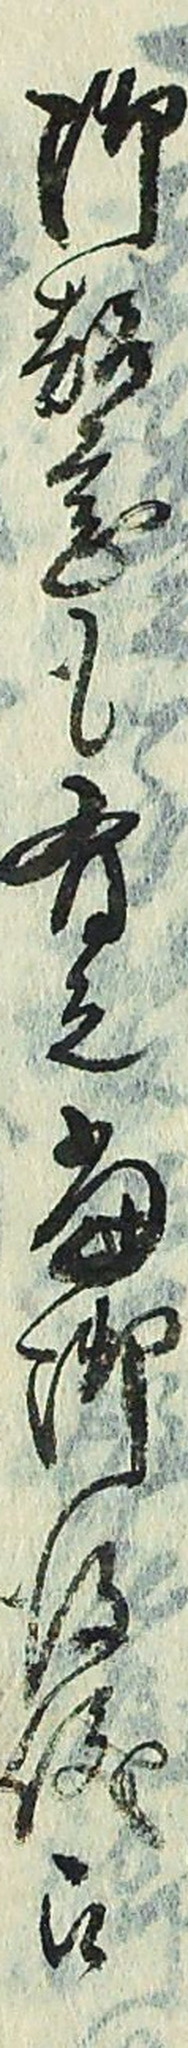御趣意も有之當御役儀被
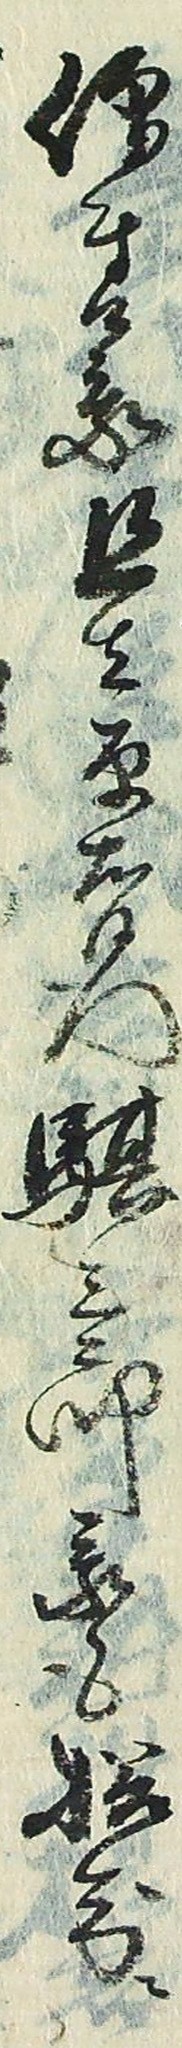仰付候義且者平右衛門騏三郎義も格別ニ
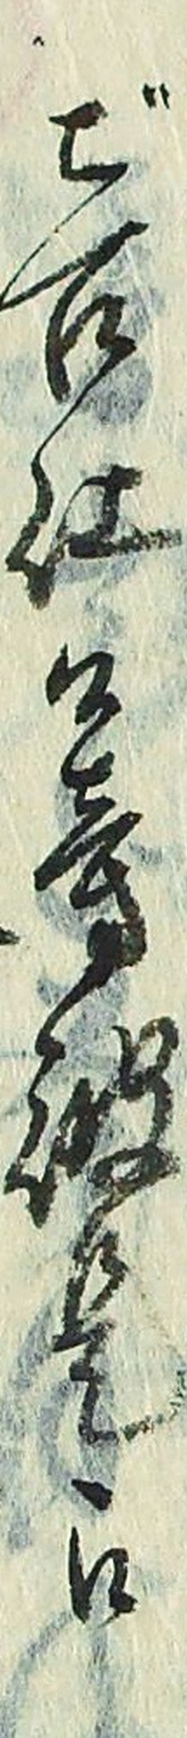被召仕候旁彼是被
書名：諸御趣意書并御下知向之写
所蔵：鳴門教育大学 Naruto University of Education
